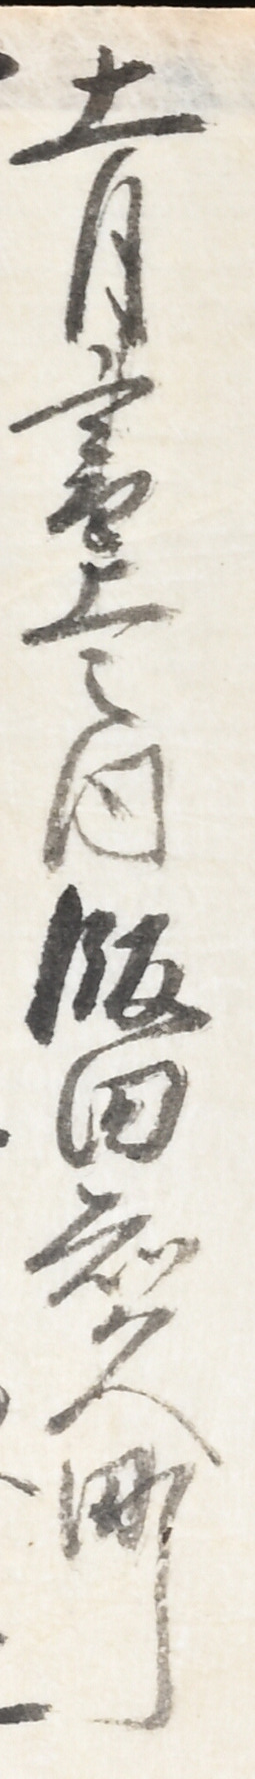十一月書上之内飯田知久町
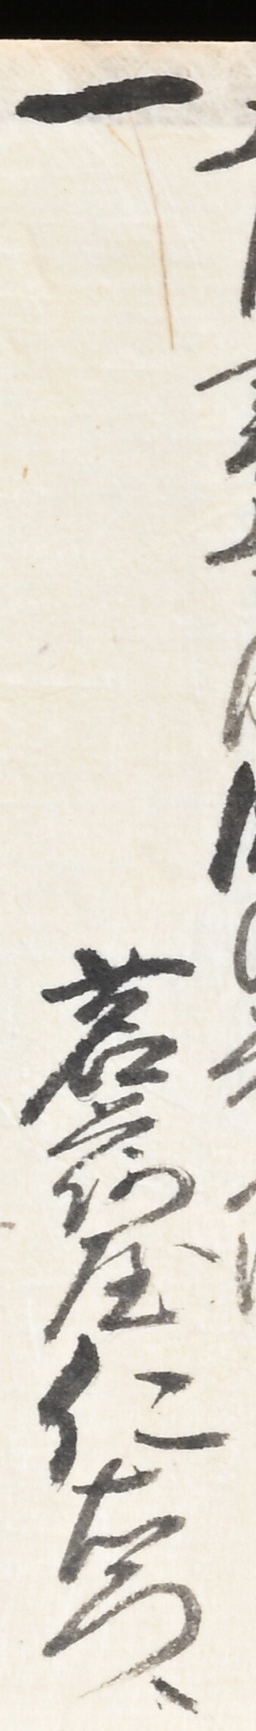一茗荷屋仁右衛門・
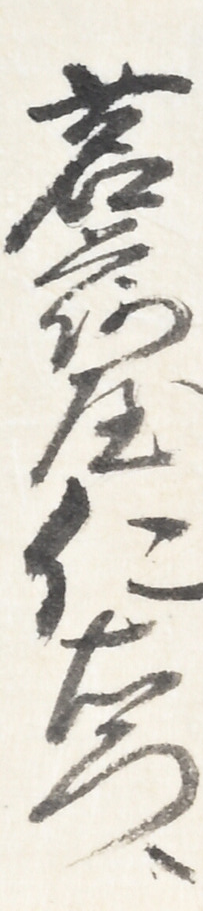一茗荷屋仁右衛門・
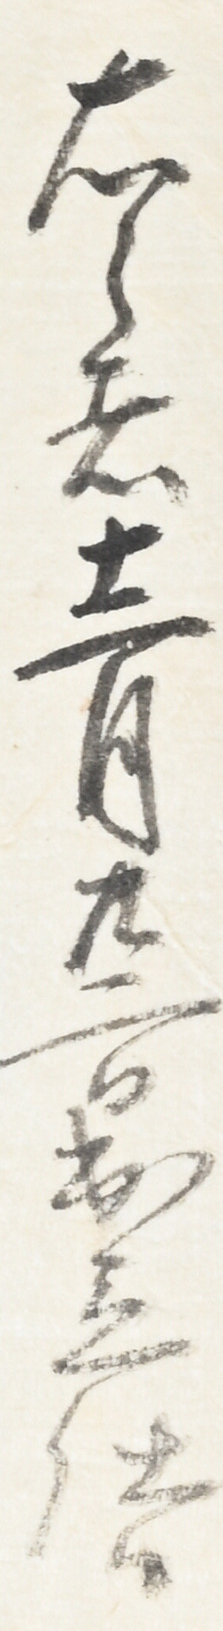右之者十二月廿二日出立仕候
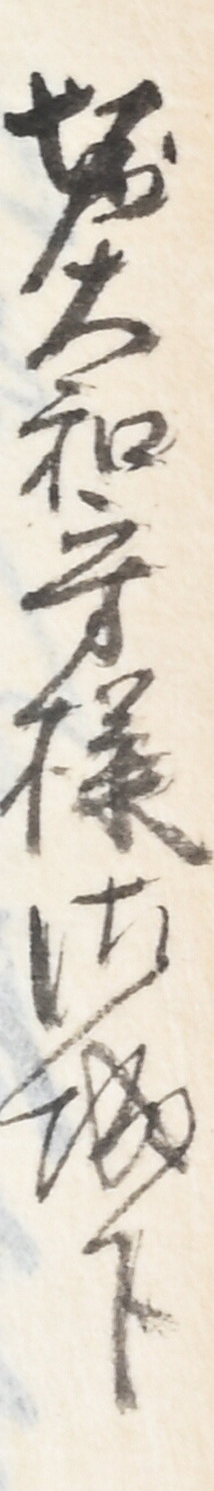堀大和守様御城下
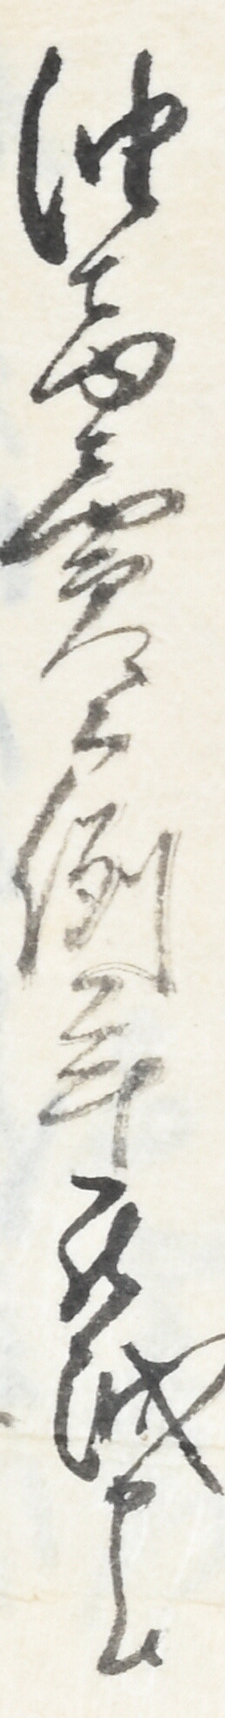薬商売ニ而例年罷越申候

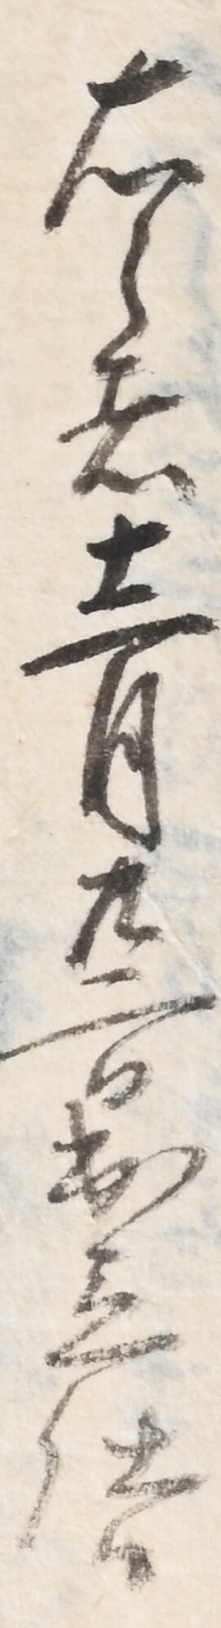右之者共同廿九日出立仕候
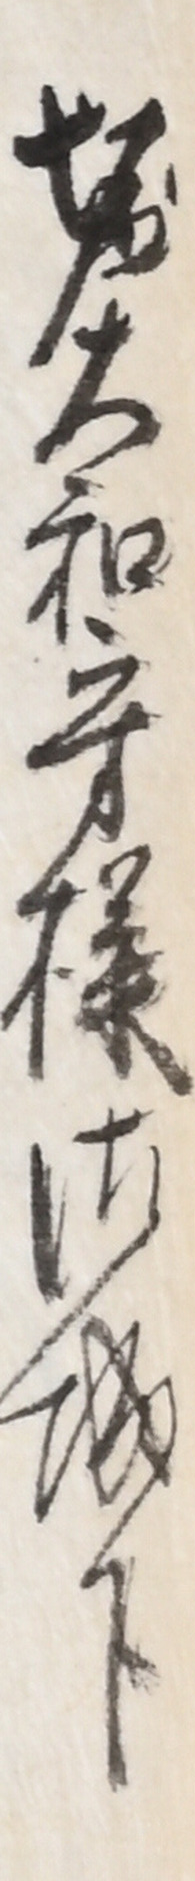堀大和守様御城下
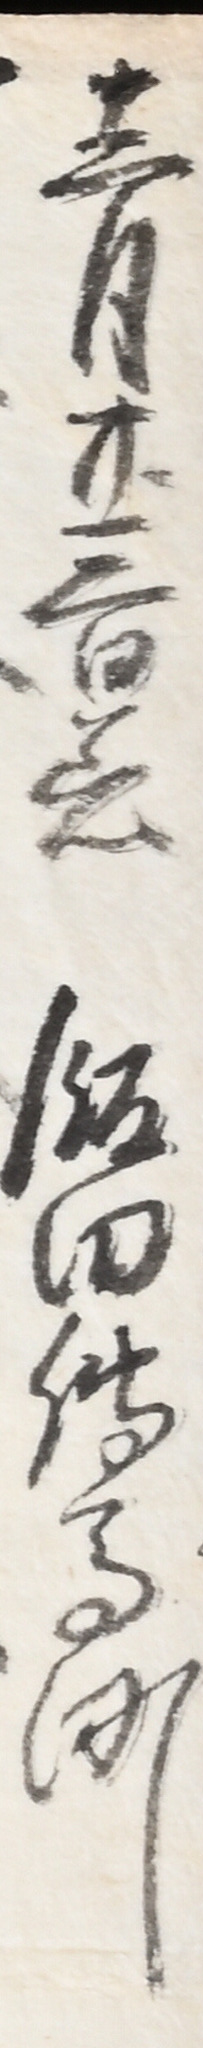十二月廿三日着飯田伝馬町
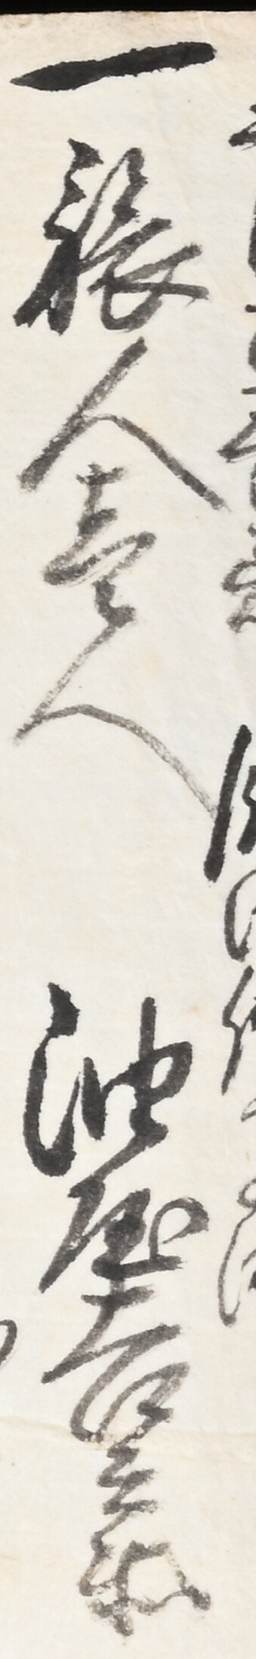一旅人壱人油屋吉兵衛
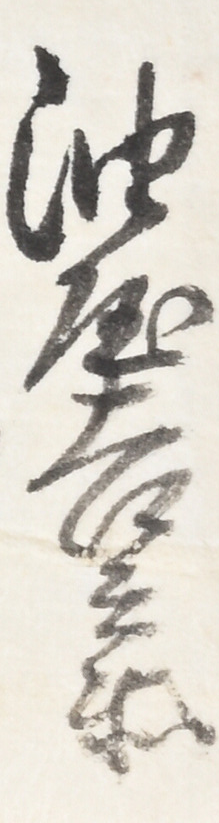万屋吉兵衛
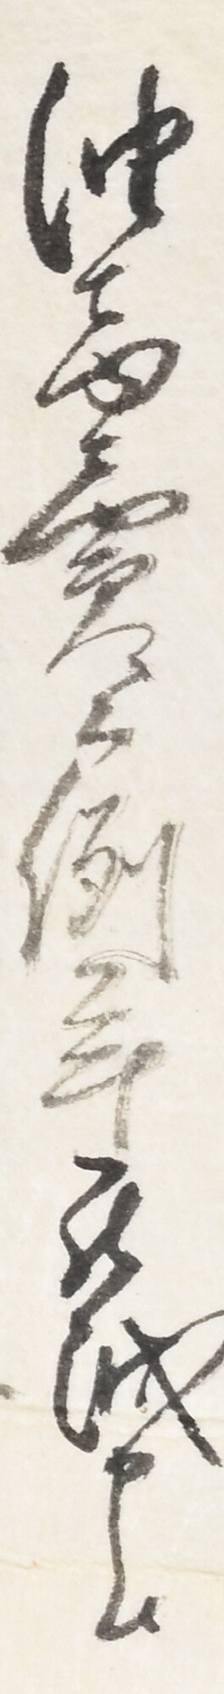油商売ニ而例年罷越申候
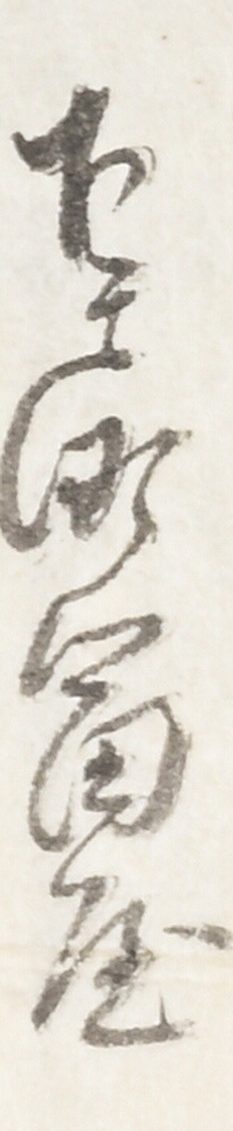下モ町冨屋
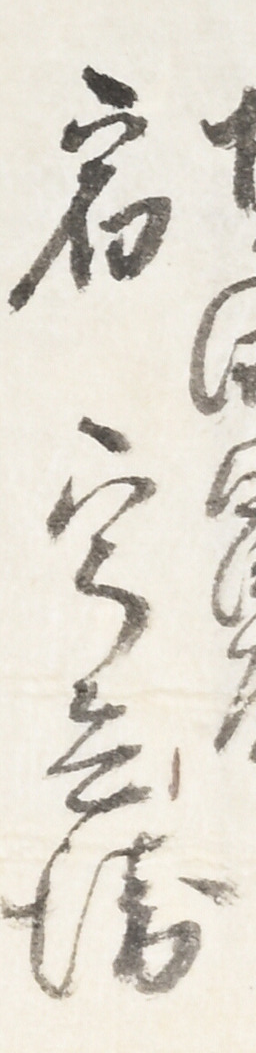宿宇兵衛
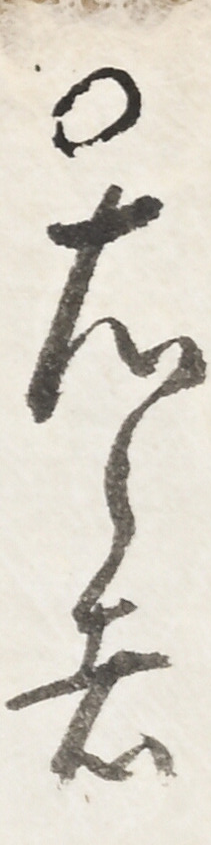〇右之者
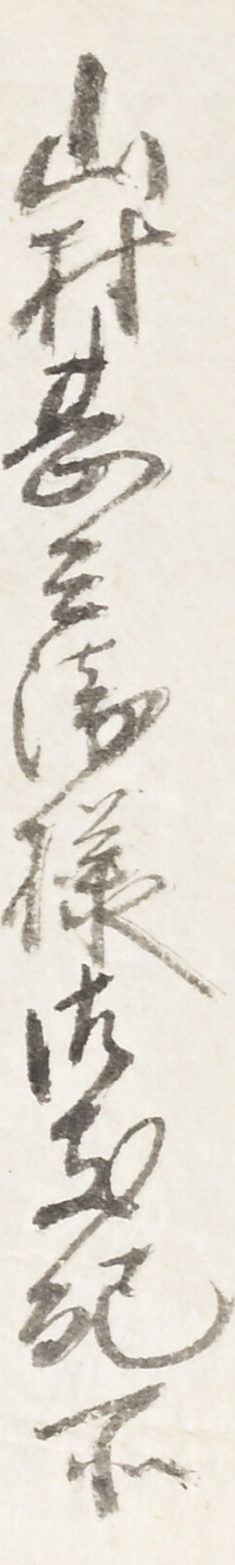山村甚兵衛様御支配所
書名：旅人泊控帳
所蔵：伊那市立高遠町図書館・合同会社AMANE
